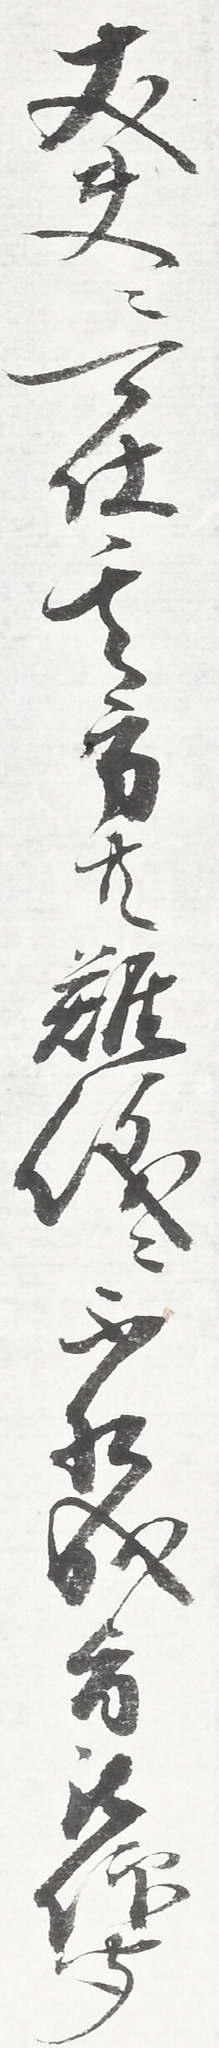丈夫に可仕其方共難儀に不相成旨被仰聞
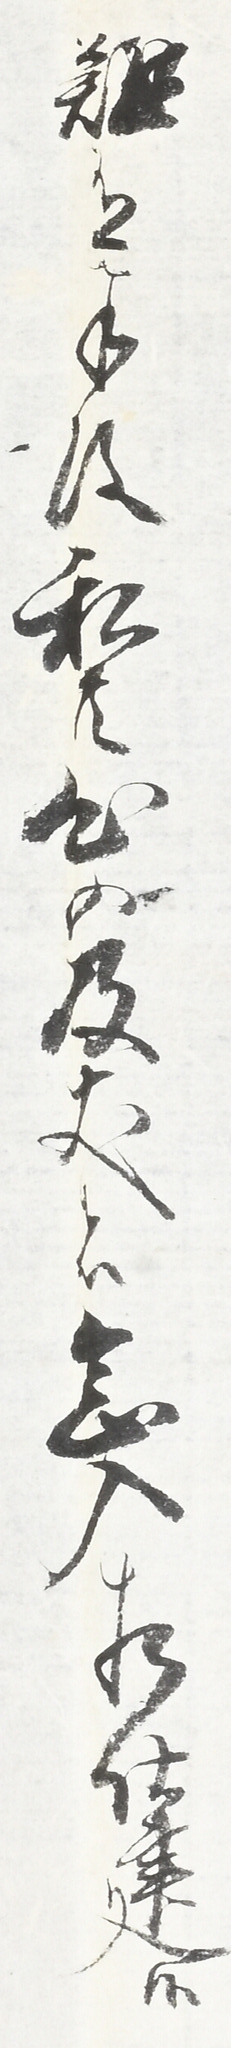難有奉存私共心の及丈者念入相仕建候
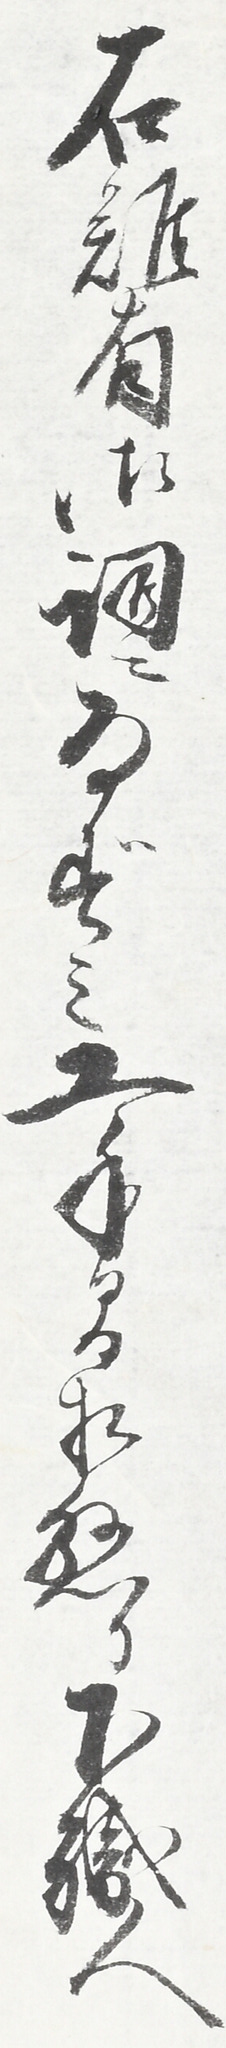右難有御詞になずみ工手間相懸り下職人

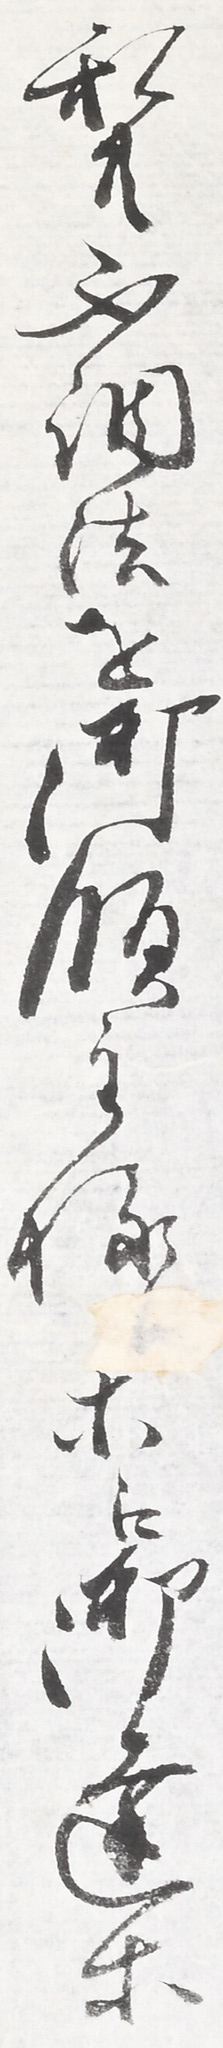私共不調法を御領主様等え御達等
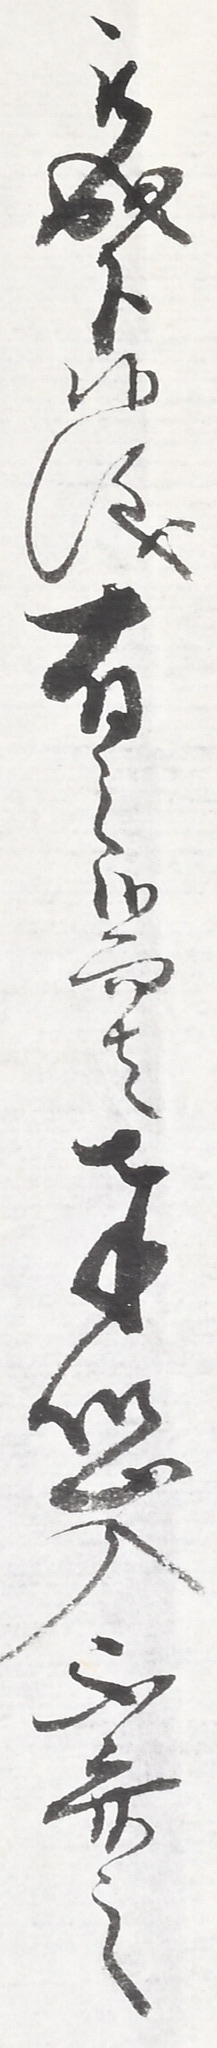被成下候儀有之候ては奉恐入不弁之
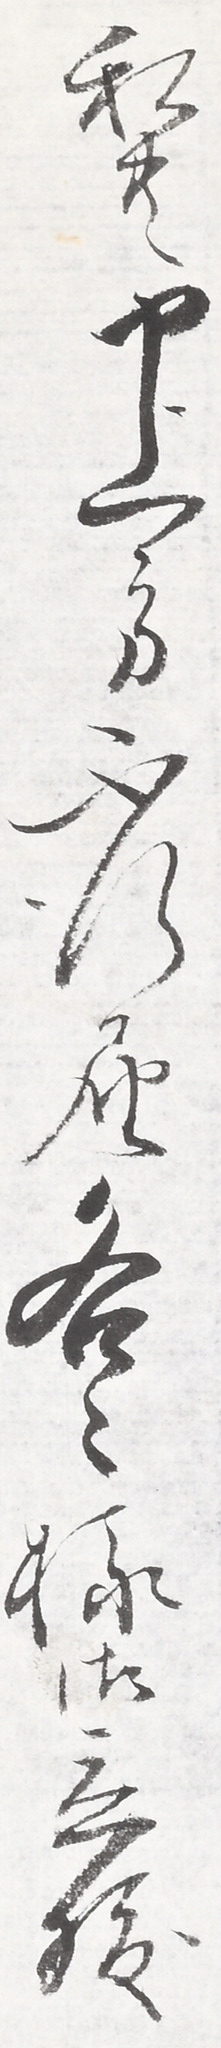私共申上方不行届各々様御立腹
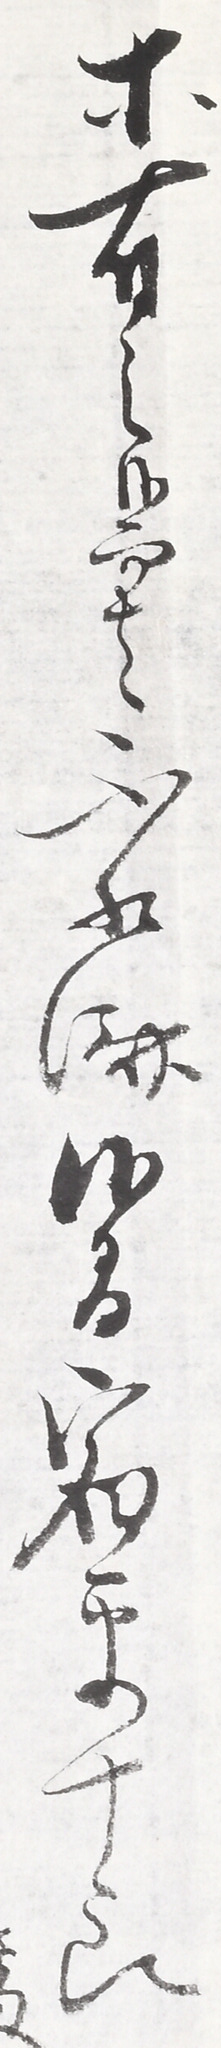等有之候ては不相済候間宿平十郎さま
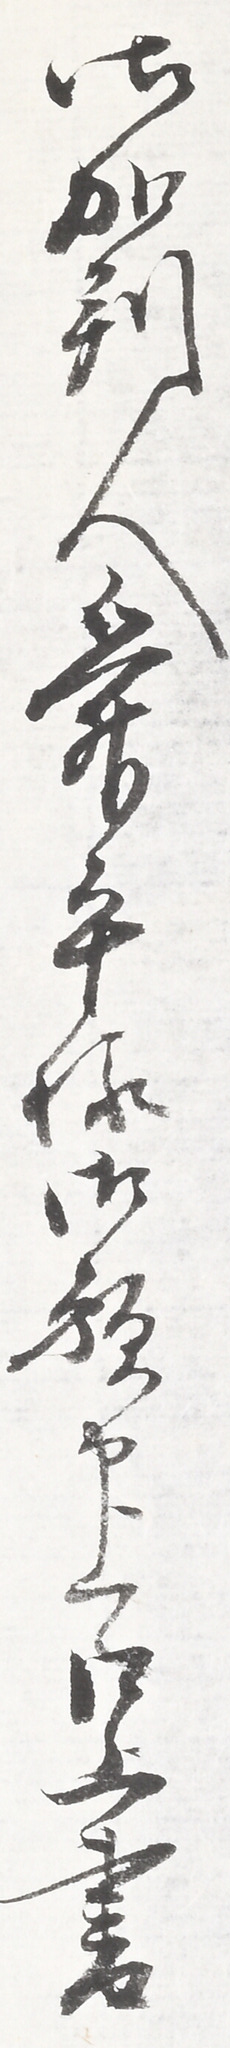御加判人舜平様御願申上口上書
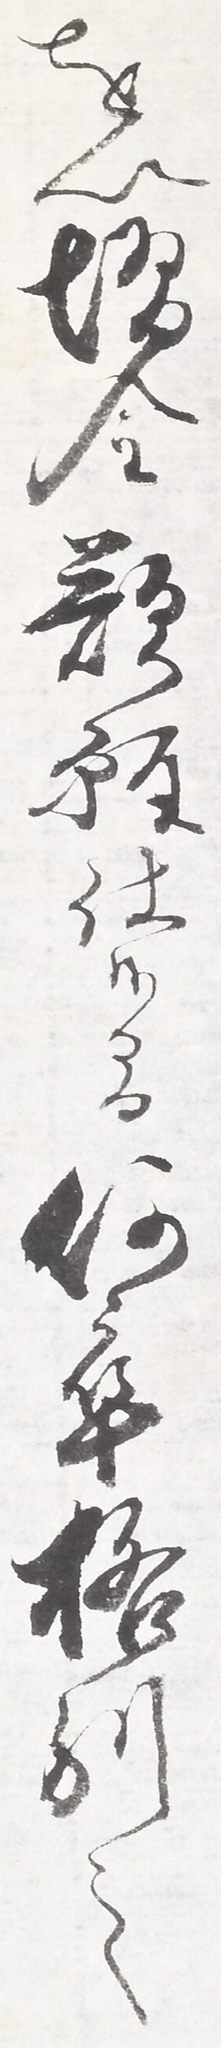を以増金歎願仕候間何卒格別之
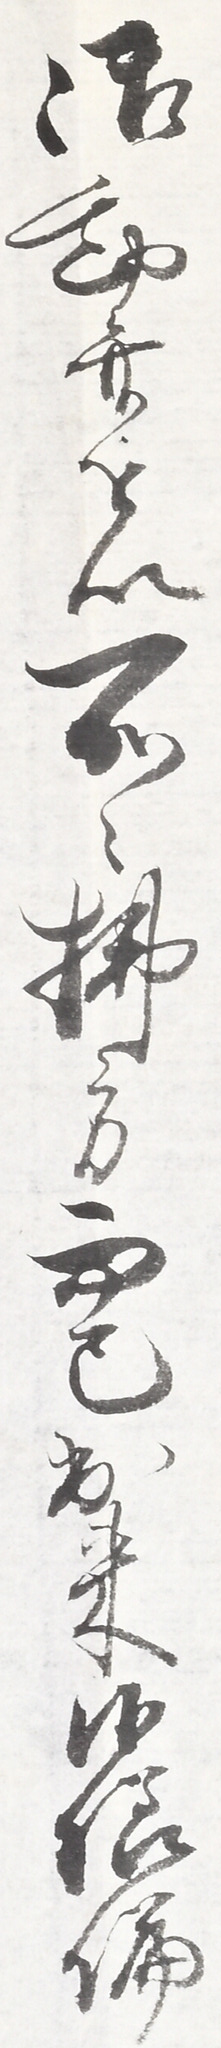御勘弁を以所々払方而已出来候様偏
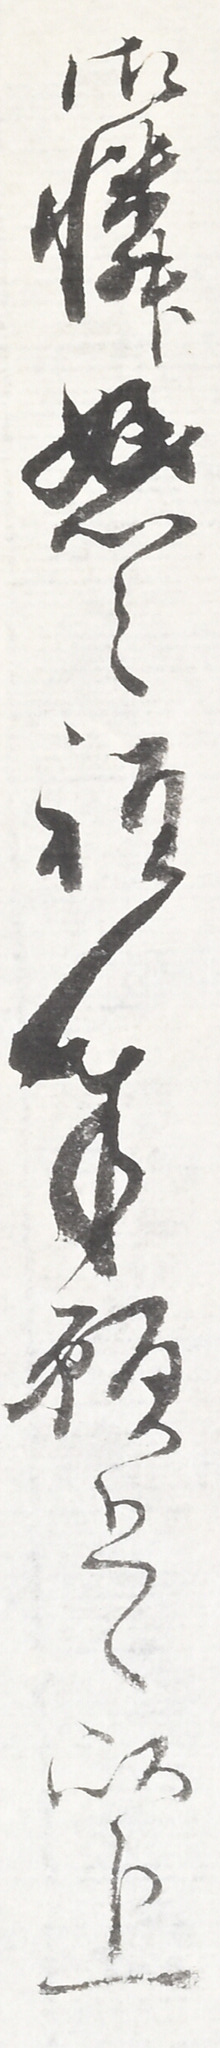御憐恕之程奉願上候以上
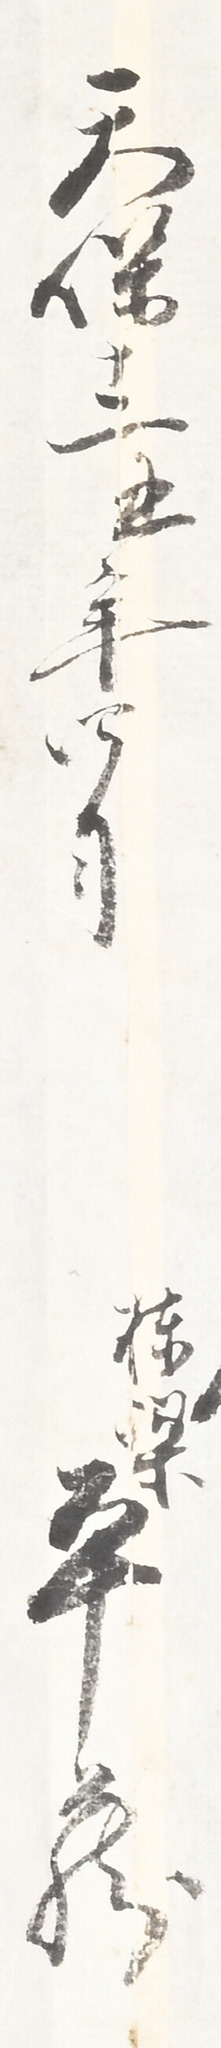天保十二丑年四月棟梁
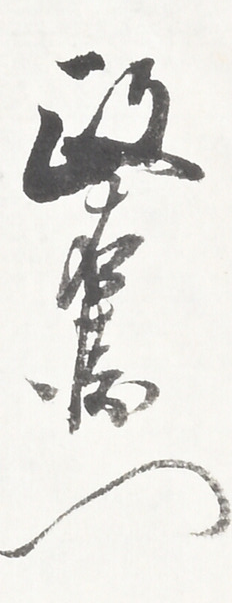政右衛門
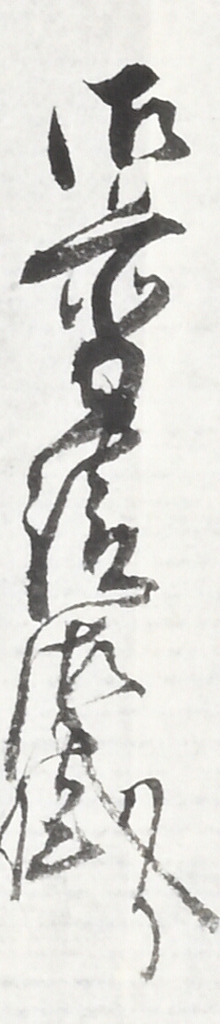御普請御掛り
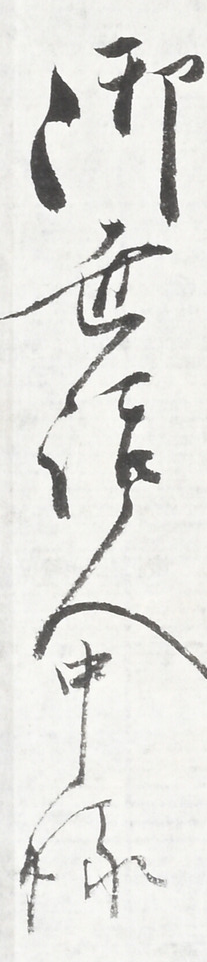御世話人中様
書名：乍恐以書付を奉願上候
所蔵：伊那市立高遠町図書館・合同会社AMANE
